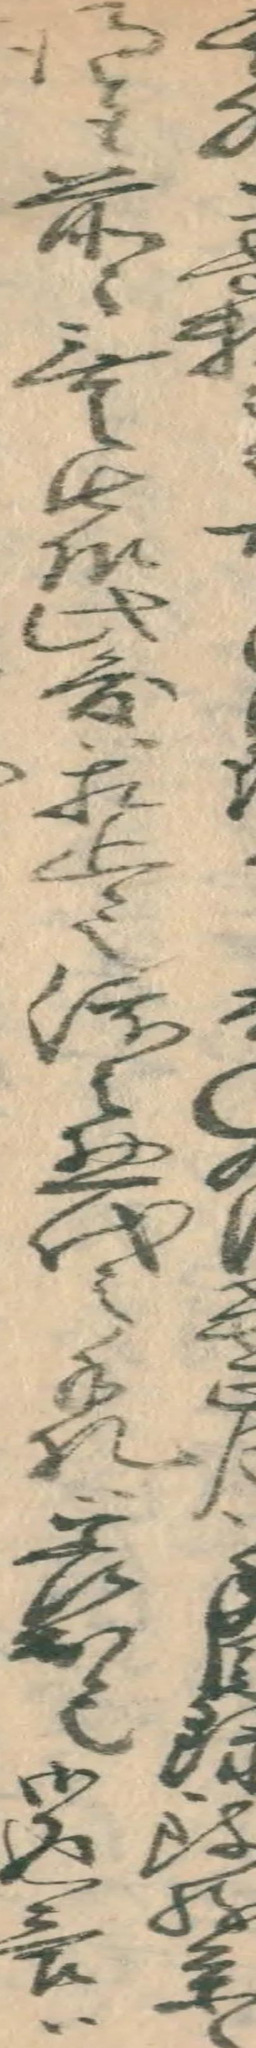得とも前々無之由故此度ハ相止候也依之惣代之手札ハ差出候也御返答ハ
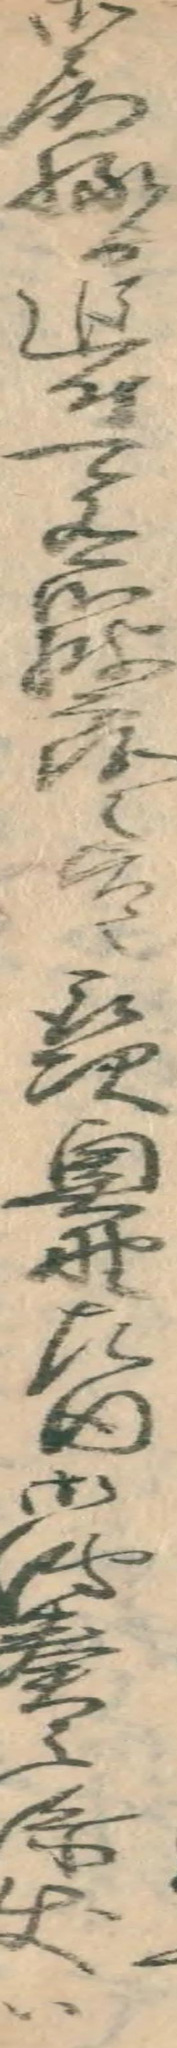御局様ゟ追付可有御披露之旨也取次奥野左内御伝奏之添使ハ
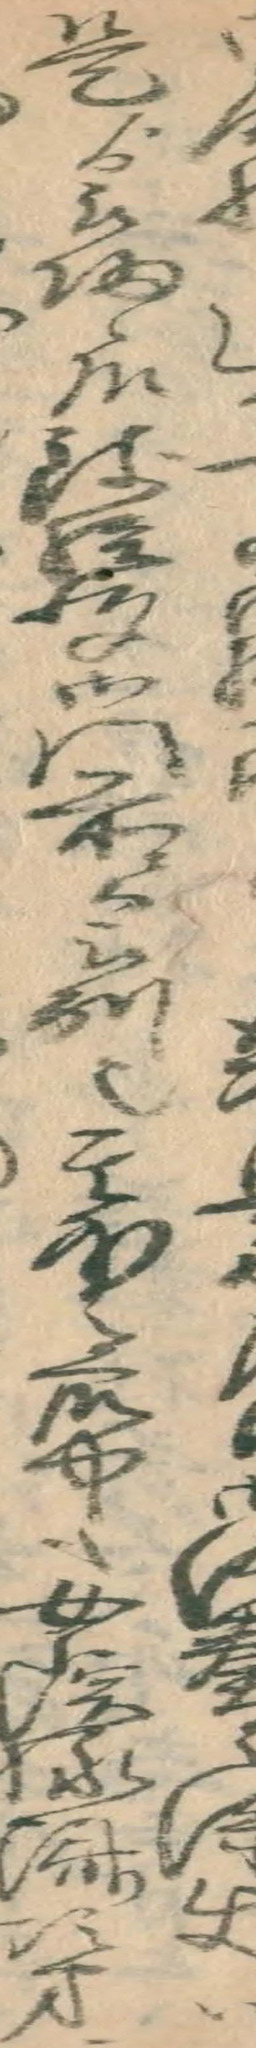是ゟ被帰候故致挨拶御門前ニ而被別也其外之衆中も女院様済次第ニ
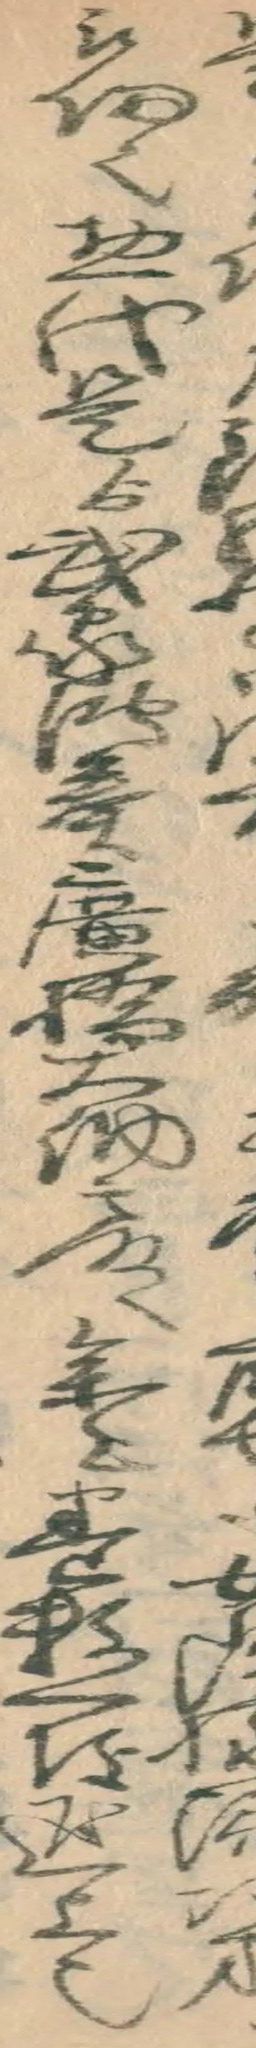被帰也惣代是ゟ武家伝奏広橋大納言殿へ参上巻数一枝進上也
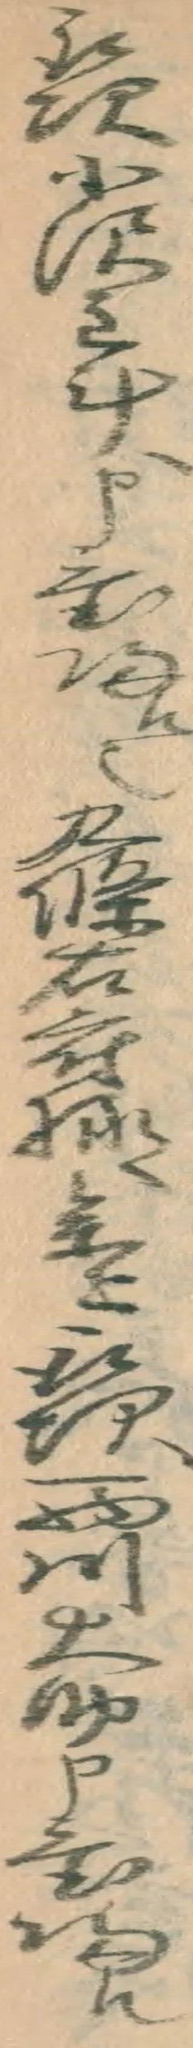取次小沢主計へ申置帰ル也九條右府様へ参上取次西川大助申置帰ル

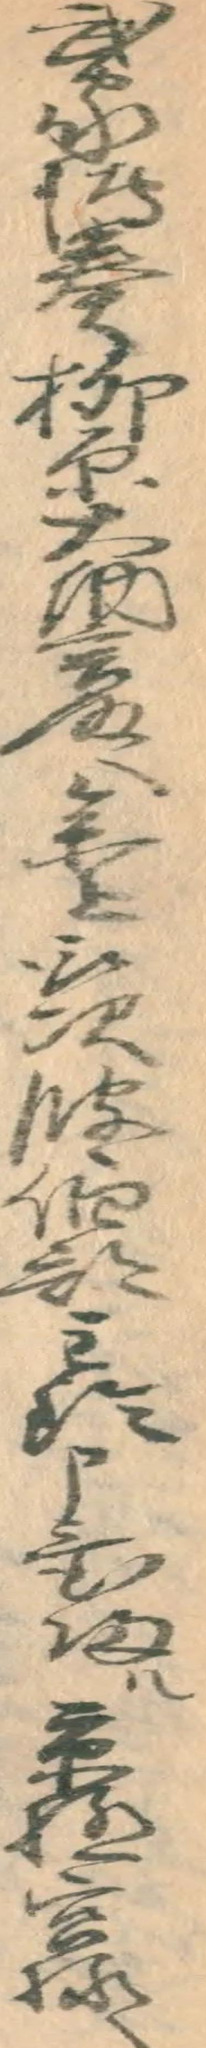武家伝奏柳原大納言殿へ参上取次波々伯部主鈴申置帰ル京極宮様へ
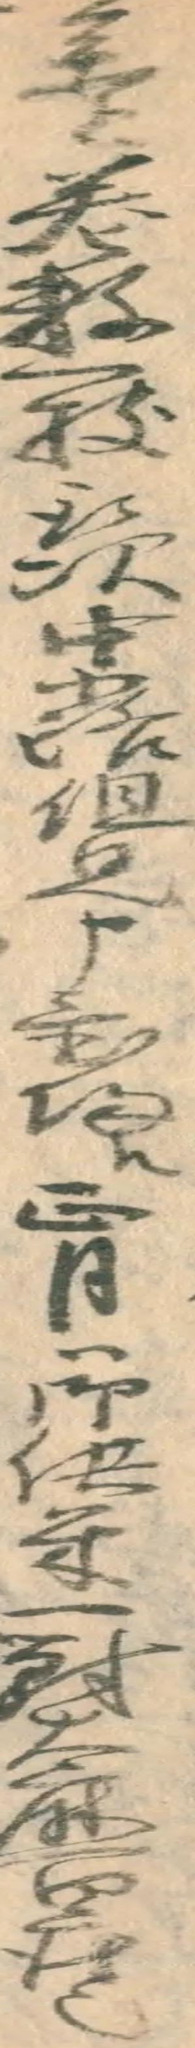参上巻数一枝取次中小路但見申置帰ル正月ハ御供米一対大麻百座也
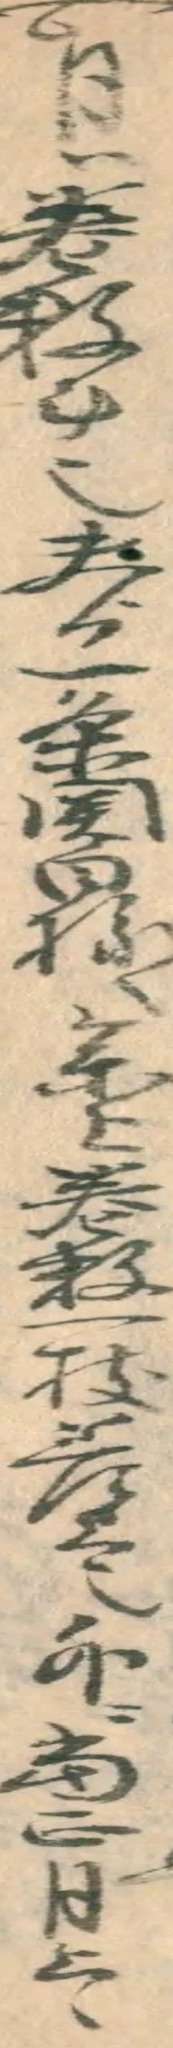五月ハ巻数計也夫ゟ一条関白様へ参上巻数一枝差上也外ニ当正月上候
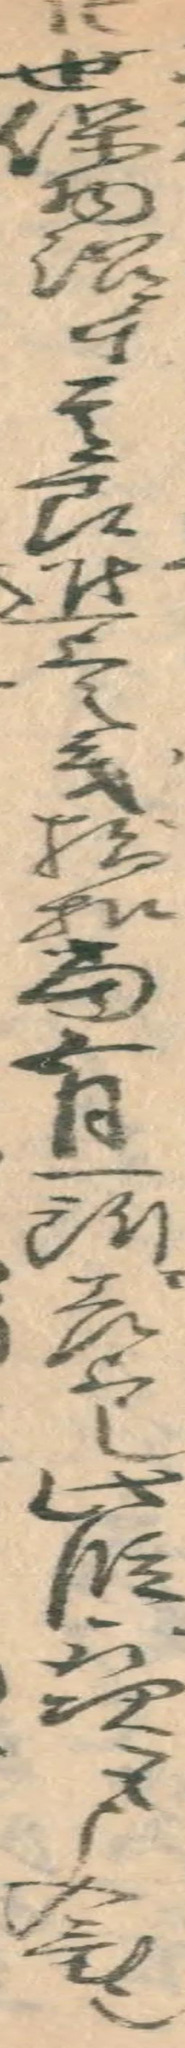由世保物語ニ付其節進上之義指扣当五月一所ニ差上申候此段取次へも申入置也
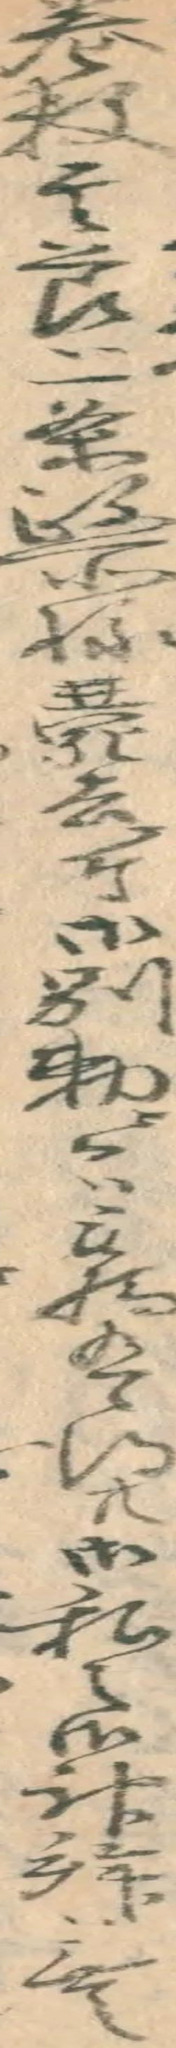巻数其節ハ一条政所様薨去ニ付御別勅ニ而ハ被指有候得共御私之御神拝ハ無之
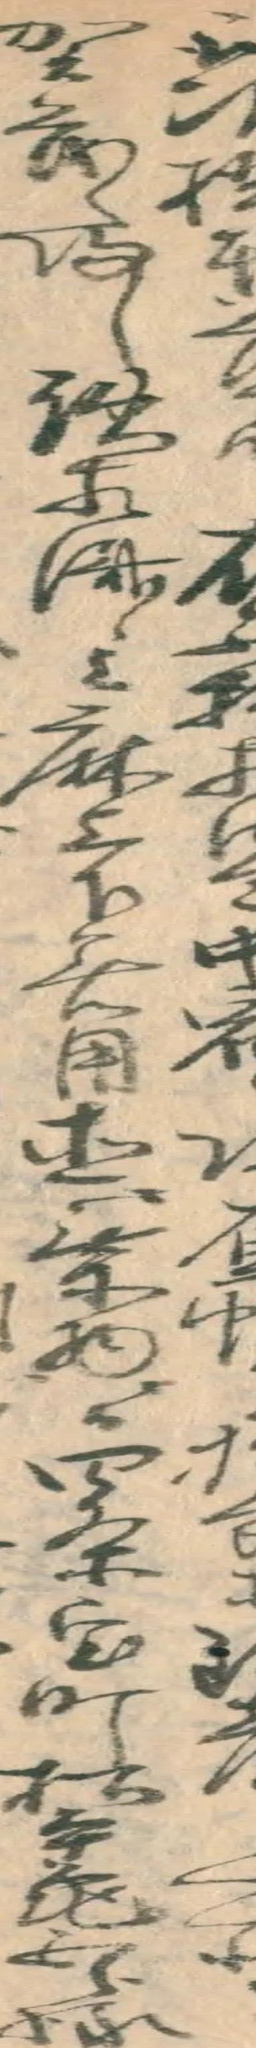駕茂へ帰し相済候上麻上下着用直ニ乗物ニ而四条室町松平亀五郎様
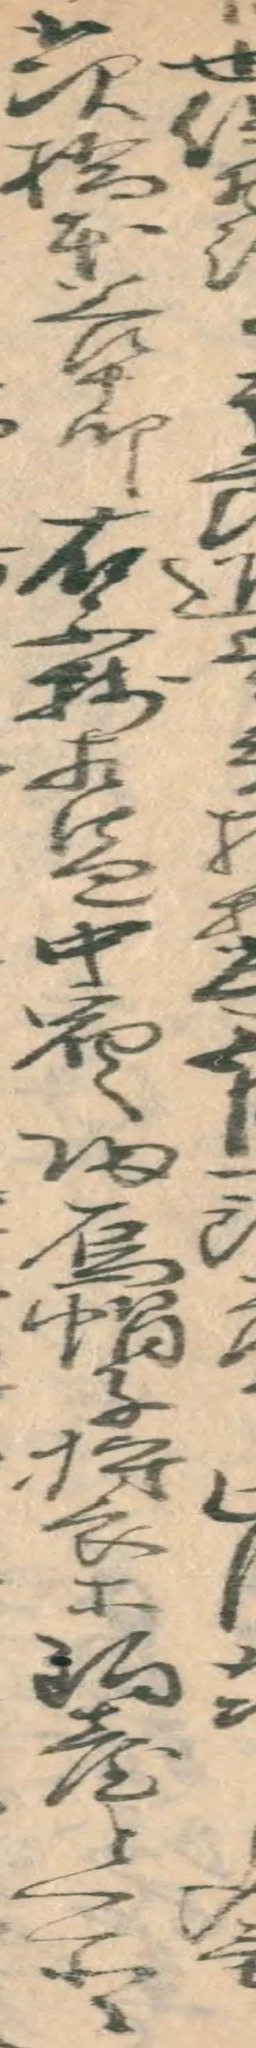取次橋本善十郎右不残相仕廻中宿へ帰烏帽子狩衣等釣台と一所ニ
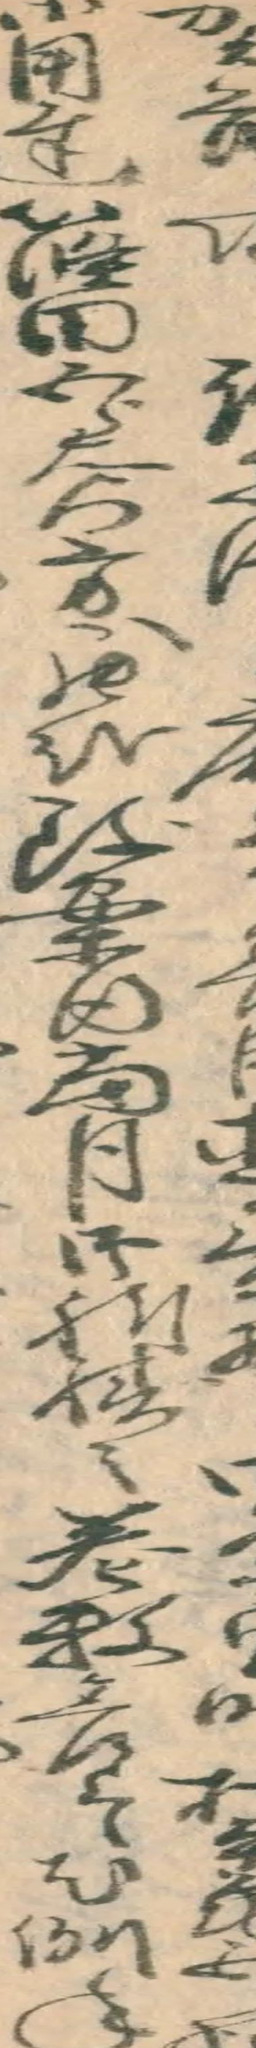御用達篠田五郎右衛門方へ罷越致案内当月御祈祷之巻数差上候尤例年
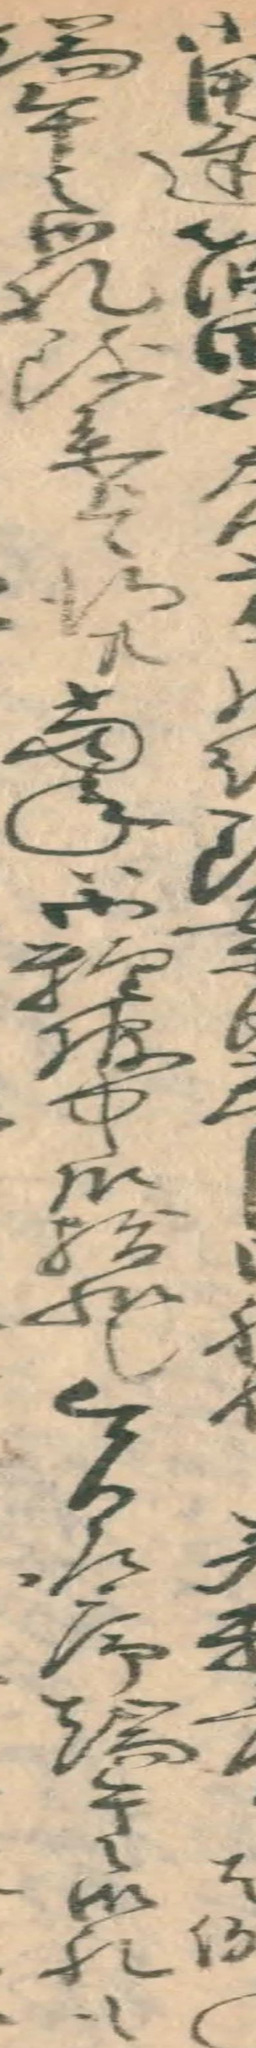端午之御礼致参上候得共当年ハ御軽服中故指扣申候今日御序端午之御礼も
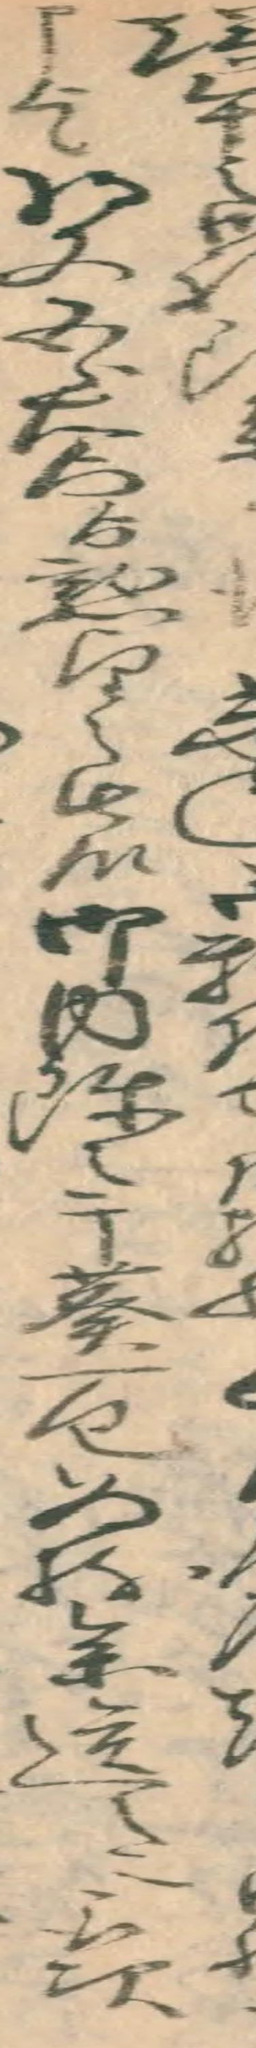申上候将又五郎右衛門ゟ熟望之由故御内陣之干葵一包為持参送之也取次
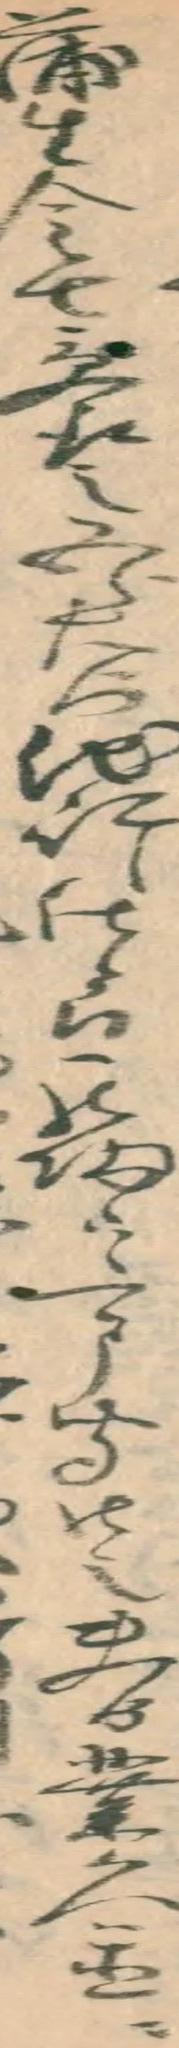蒲生金七受取也五郎右衛門他行仕候間罷帰候ハヽ可申聞由也夫ゟ業久ハ直ニ
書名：賀茂社記録. 第58冊
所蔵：国立国会図書館 National Diet Library, JAPAN
